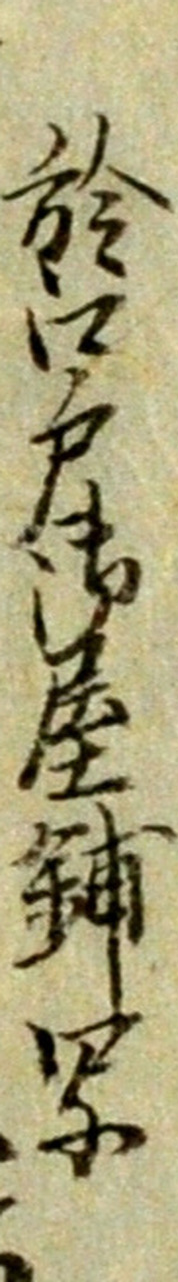於江戸御屋舗写
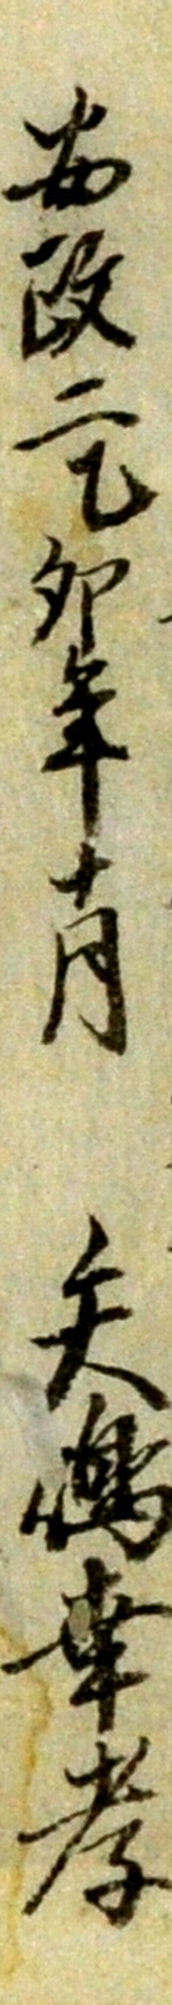安政二乙卯年十月矢嶋幸孝
